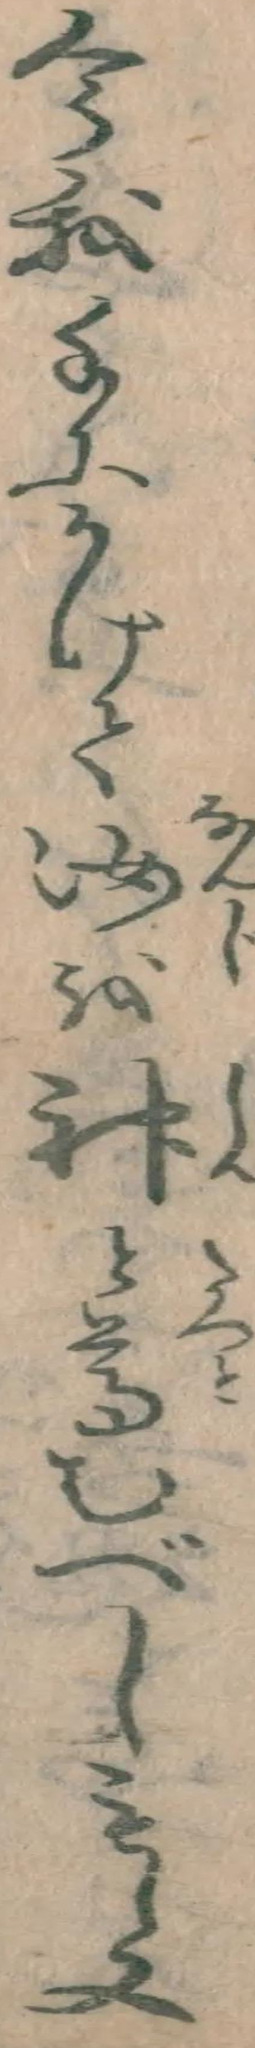今我手にかけて汝を神と尊むべしもし又
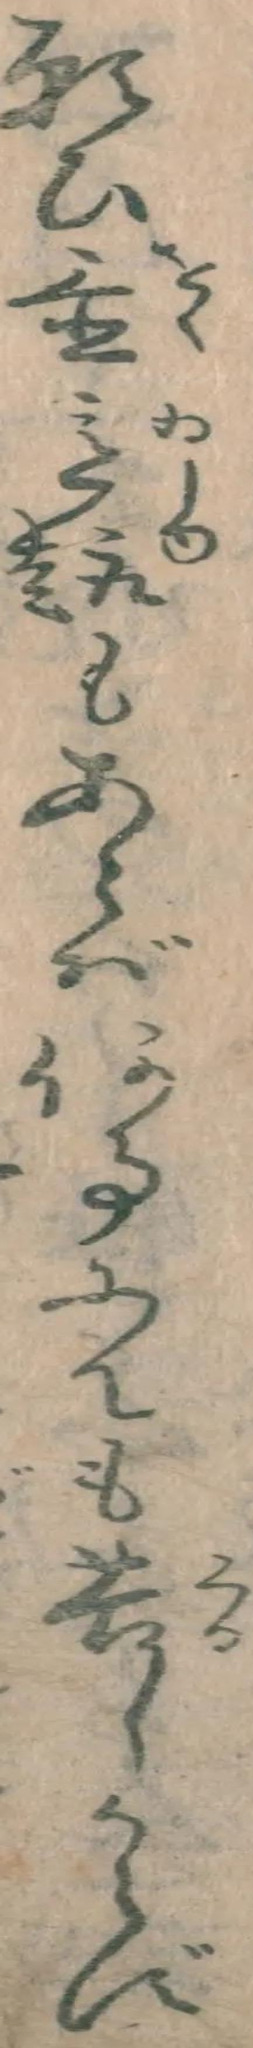願ひ置意趣もあらば何事にても苦しからず
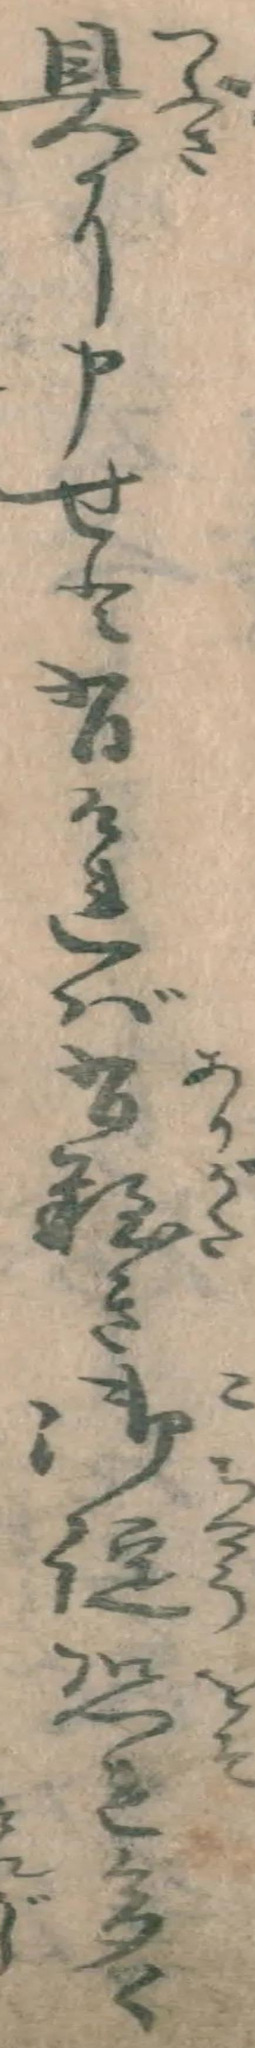具に申せと有ければ有難き御諚恐れ多く
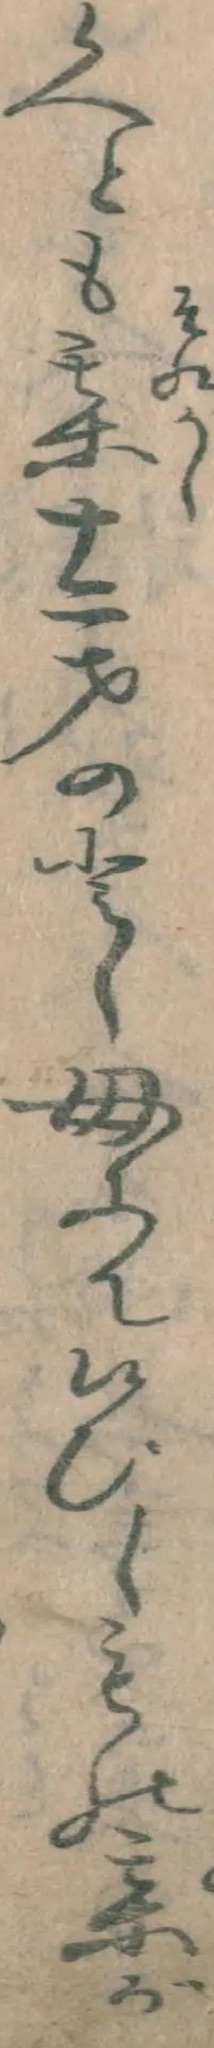候へとも某十二才のとし母にて候ひしもの某が
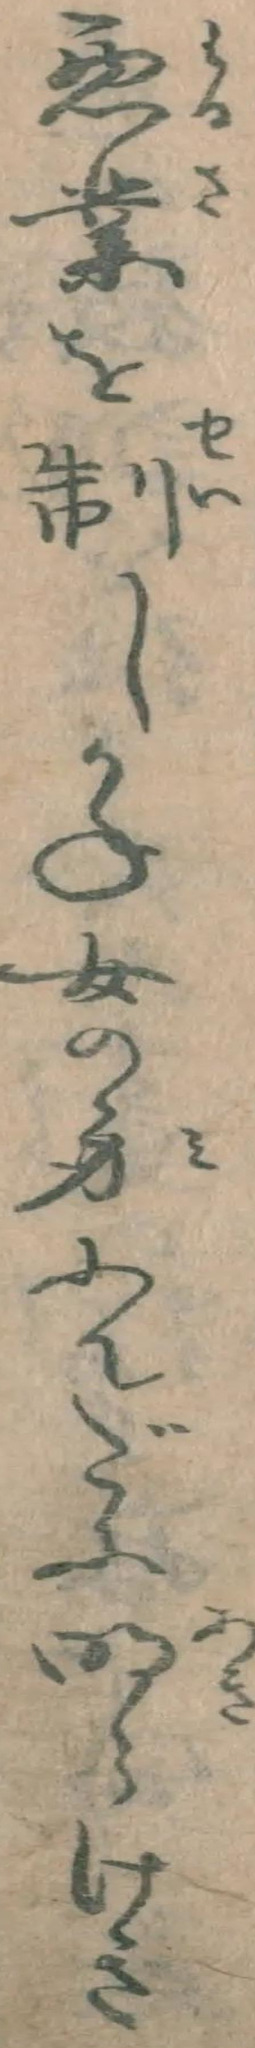悪業を制しかね女の身にてだに明らけき

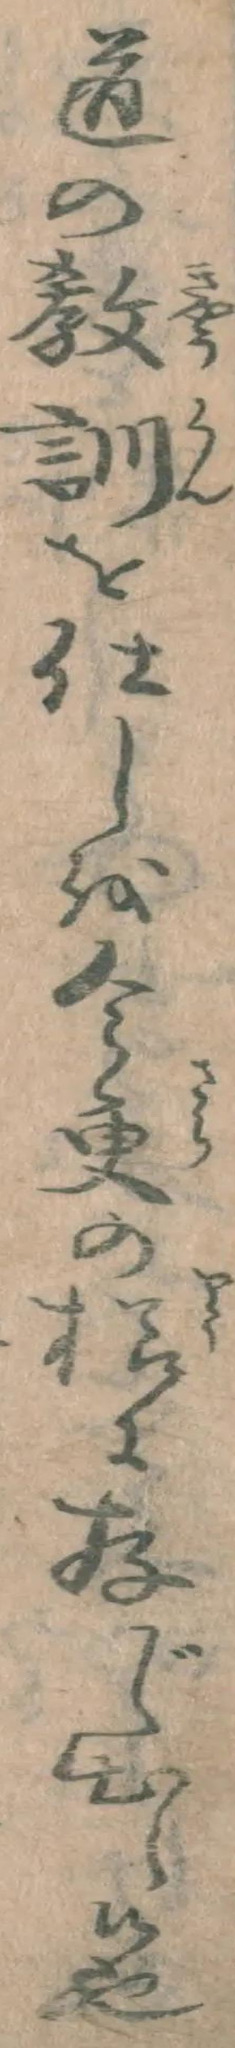道の教訓を仕しを今更の様に存じ出し候也
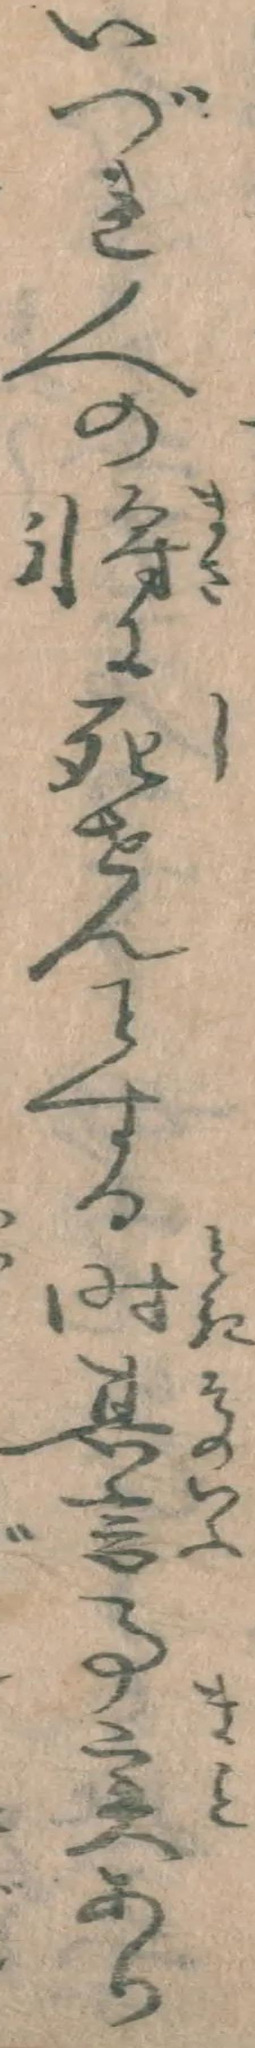いづれ人の将に死せんとする時其言事実あり
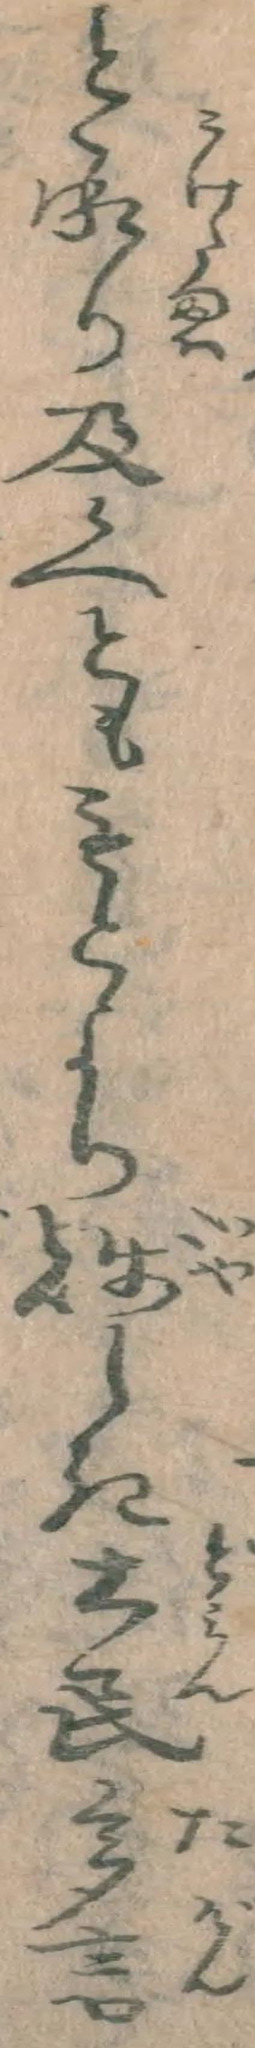と承り及候へとももとより賎しき土民多言
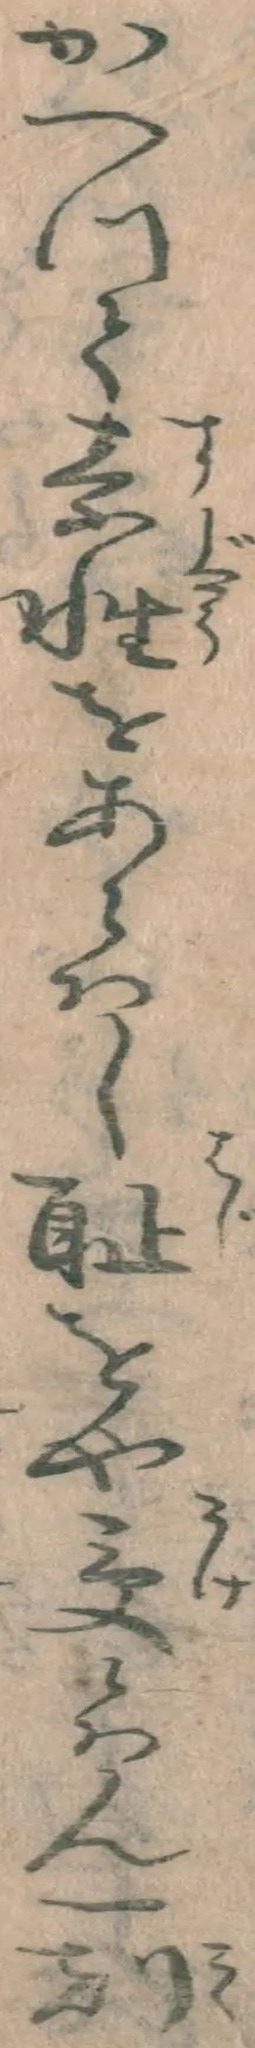かへつて素性をあらはし恥をや受候はん一刻
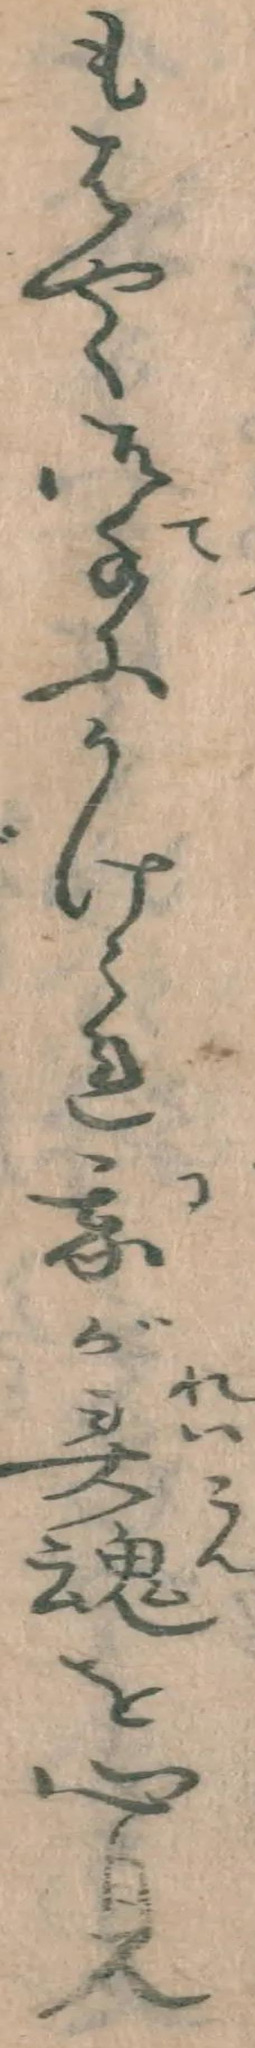もはやく御手にかけられ我が霊魂を心見
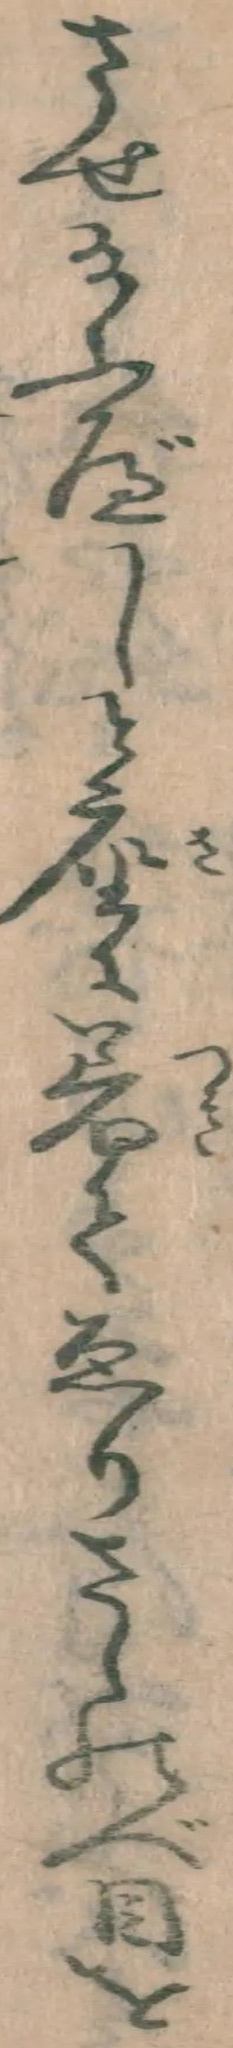させ給ふべしと座に着てゑりさしのべ目を
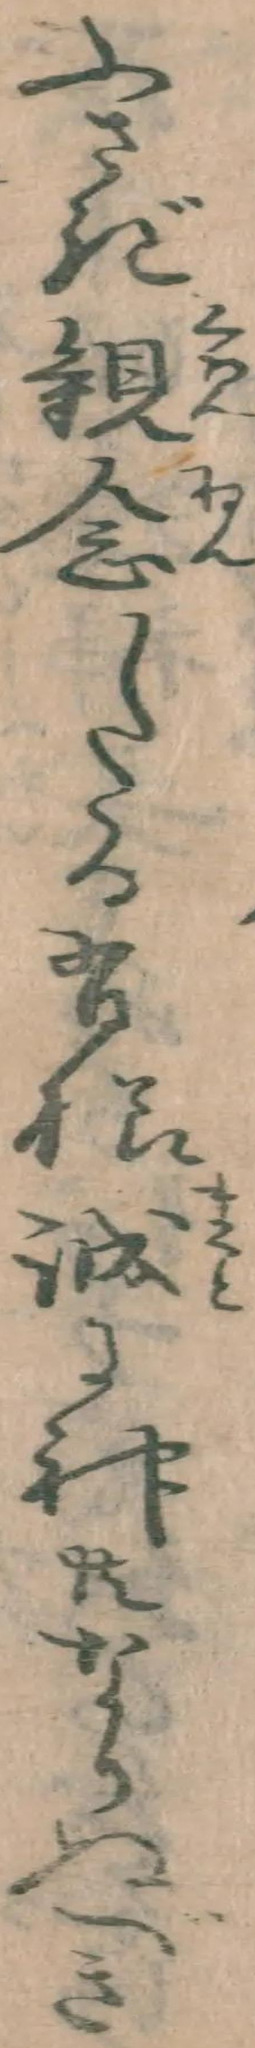ふさぎ観念したる有様誠に神共なりぬべき
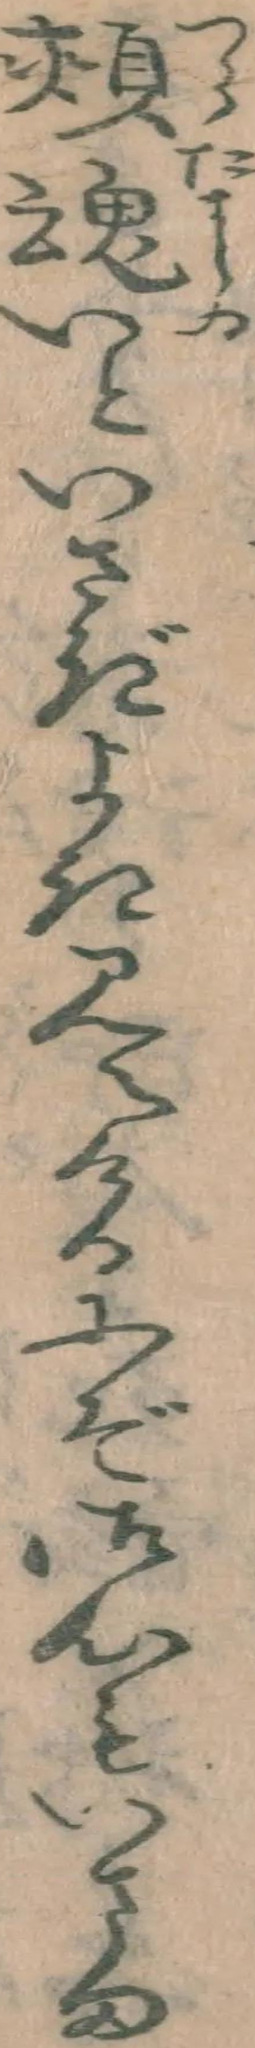頬魂いといさぎよき見えけるにぞ御心もいさま
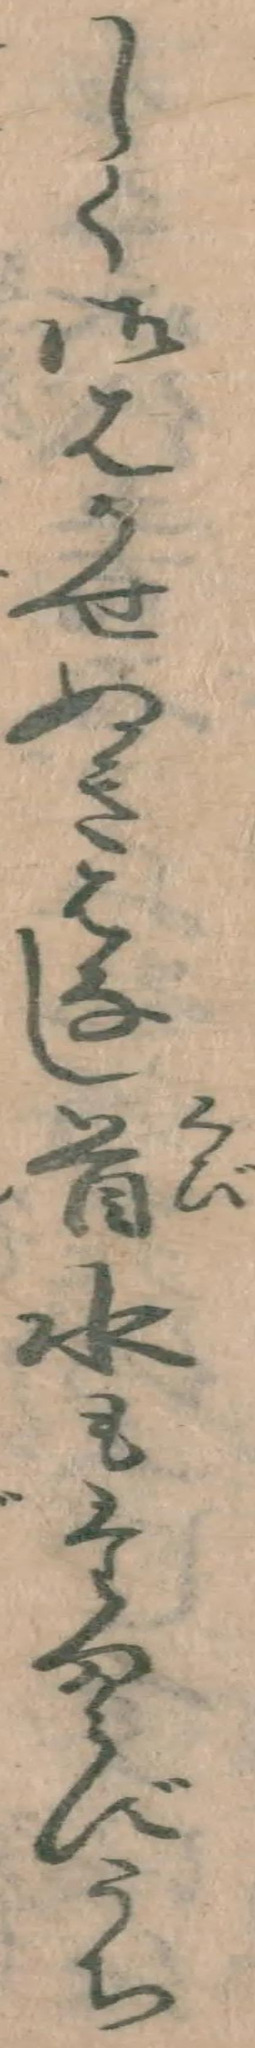しく御はかせぬきはなし首水もたまらずうち
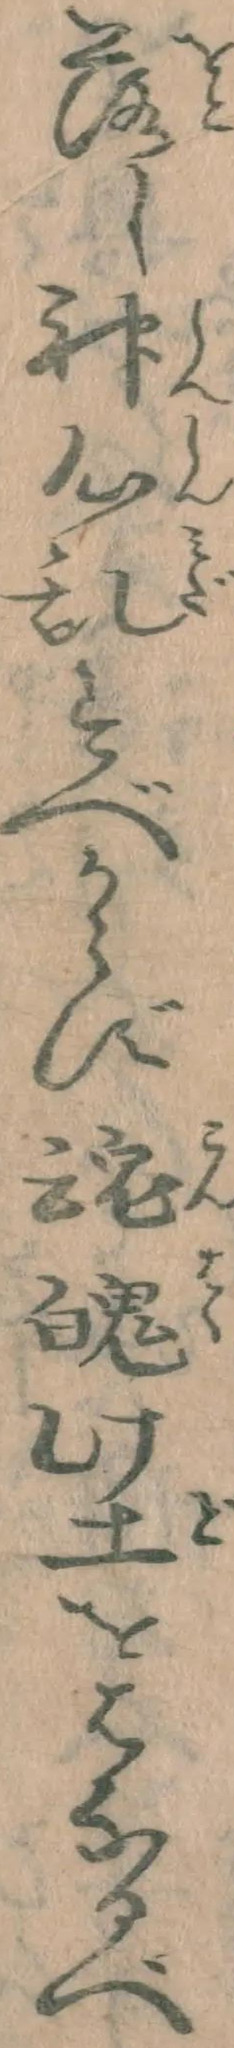落し神心乱すべからず魂魄此土をはなるべ
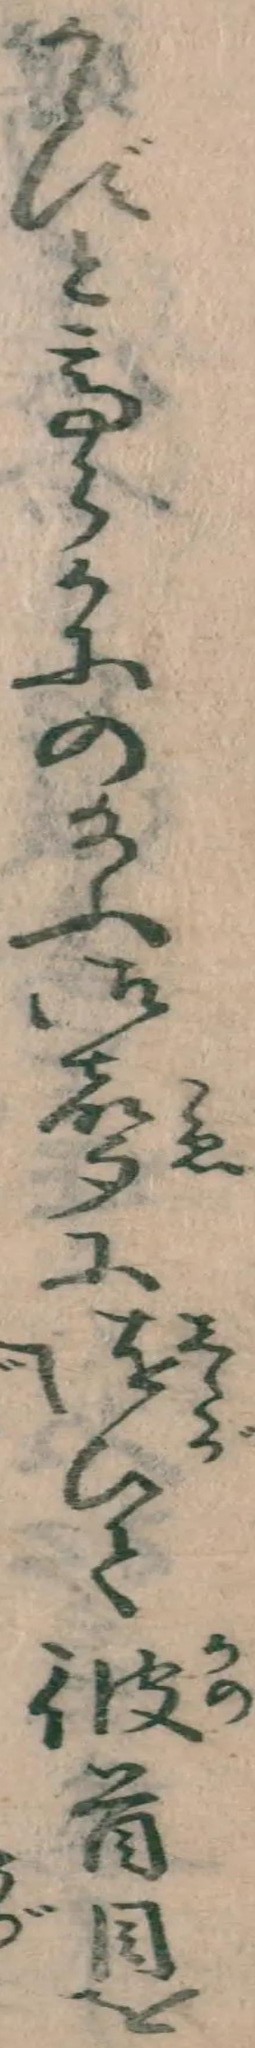からずと高らかにの給ふ御声に従ひて彼首目を
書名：怪談御伽童 5巻. [1]
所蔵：国立国会図書館 National Diet Library, JAPAN
